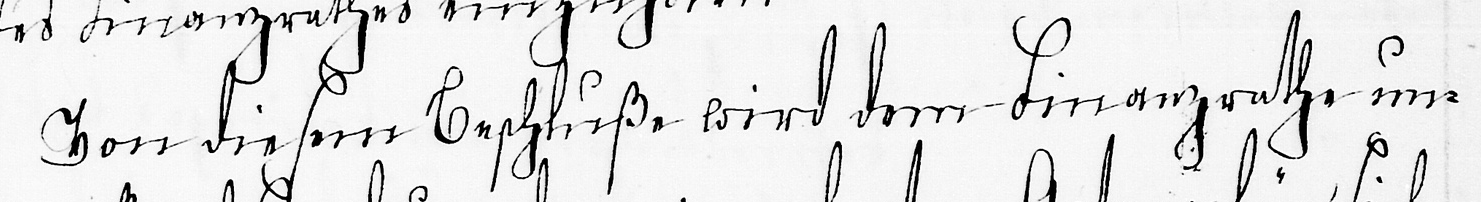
Von diesem Beschluße wird dem Finanzrathe un¬
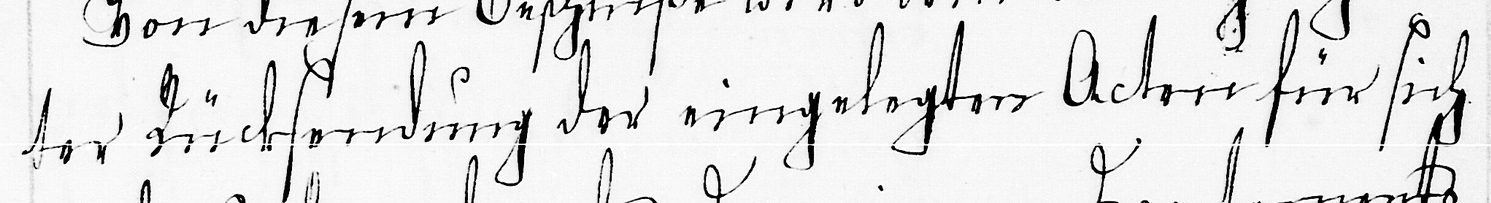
ter Rücksendung der eingelegten Acten für sich
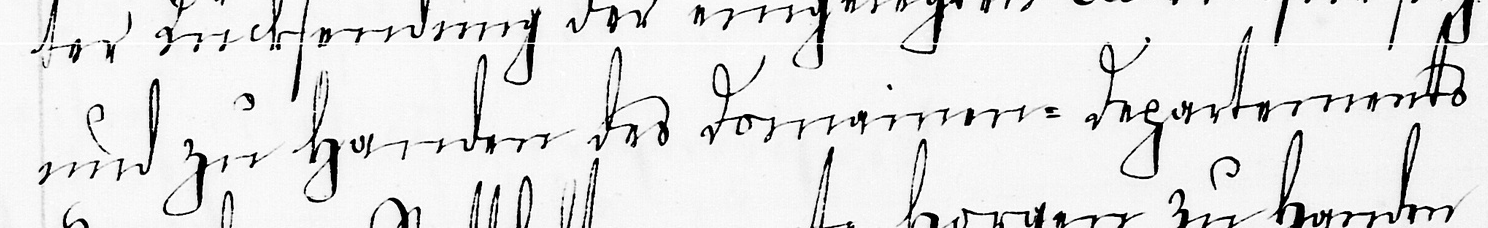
und zu Handen des Domainen-Departements
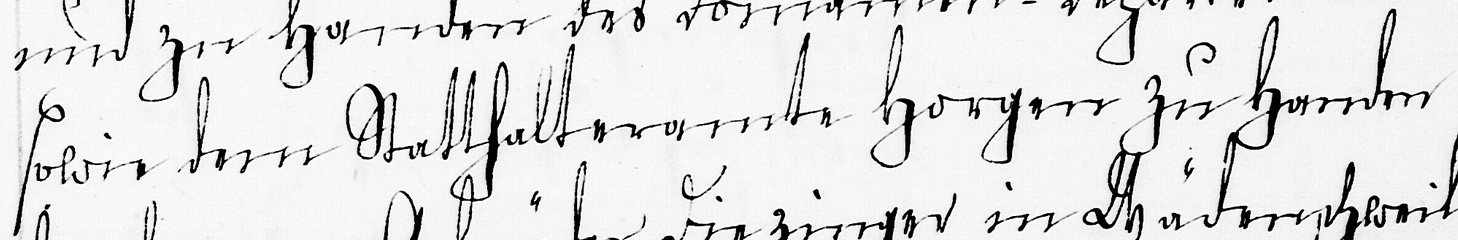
sowie dem Statthalteramte Horgen zu Handen
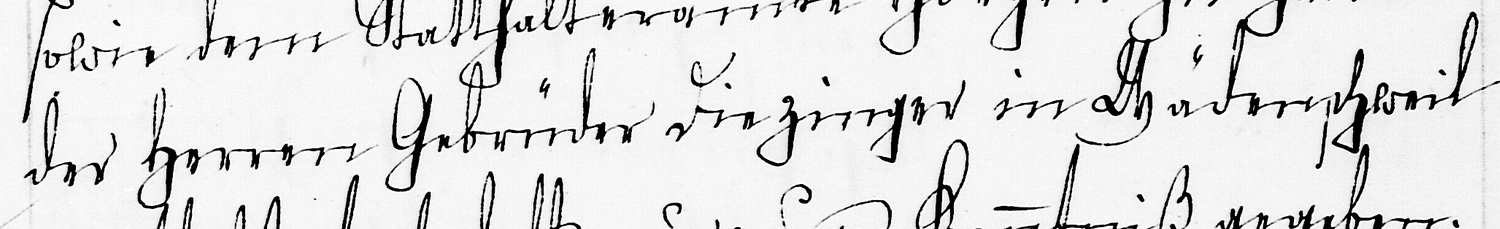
der Herren Gebrüder Diezinger in Wädenschweil
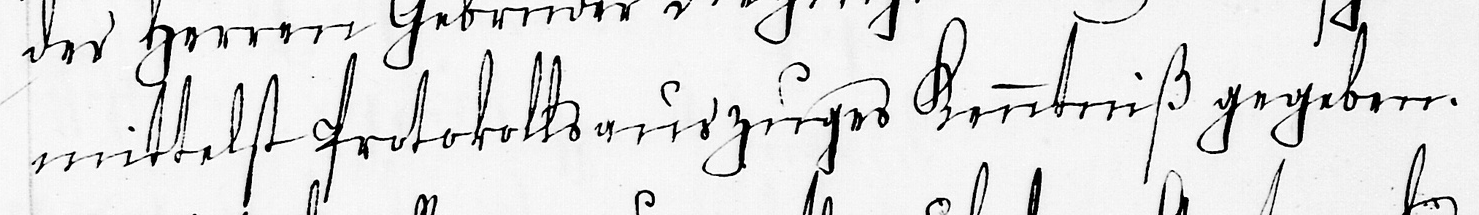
mittelst Protokollsauszuges Kenntniß gegeben.
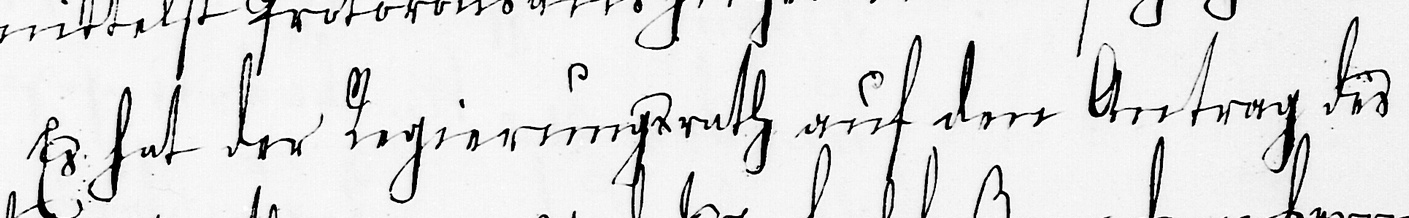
Es hat der Regierungsrath auf den Antrag des
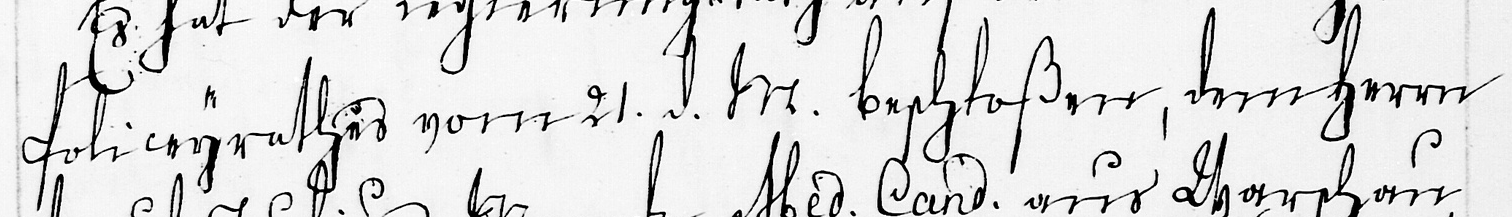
Policeyrathes vom 21. d. M. beschloßen, dem Herrn
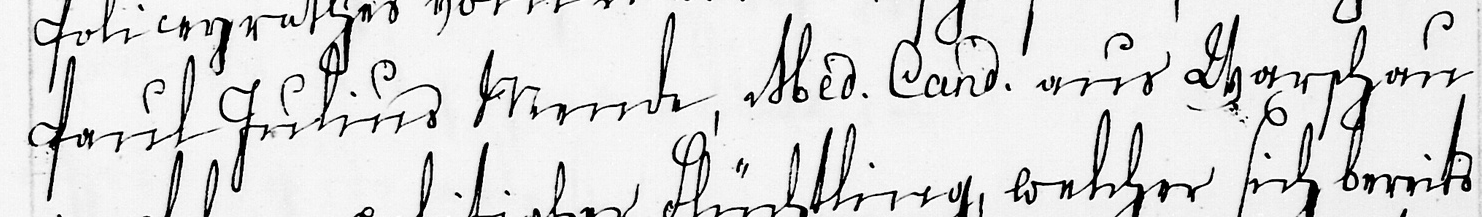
Paul Julius Mende, Med. Cand. aus Warschau
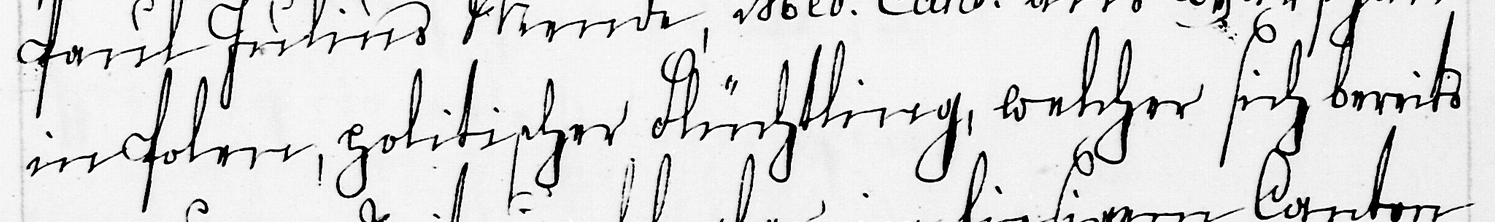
in Polen, politischer Flüchtling, welcher sich berei¬
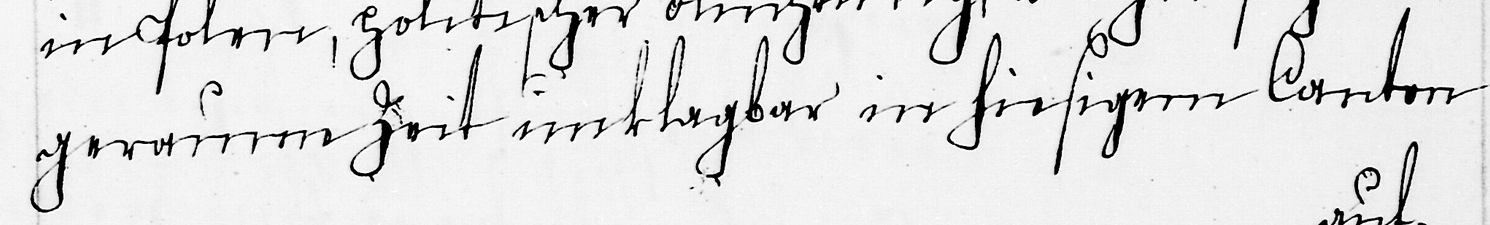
geraume Zeit unklagbar in hiesigem Canton
